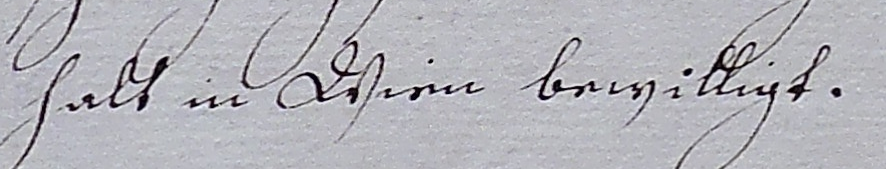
halt in Wien bewilligt.
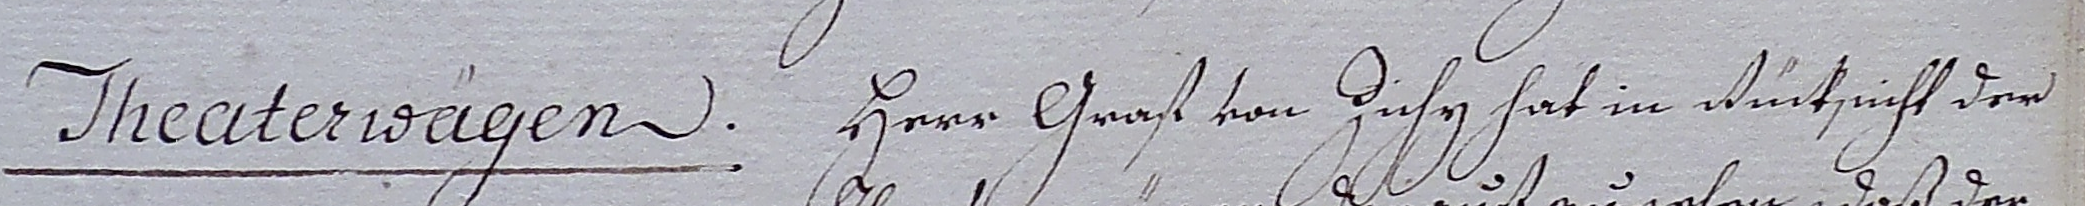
Theaterwägen. Herr Graf von Zichy hat in Rücksicht der
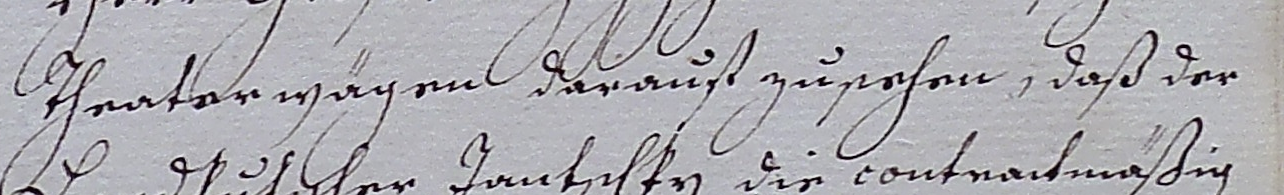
Theaterwägen darauf zusehen, daß der
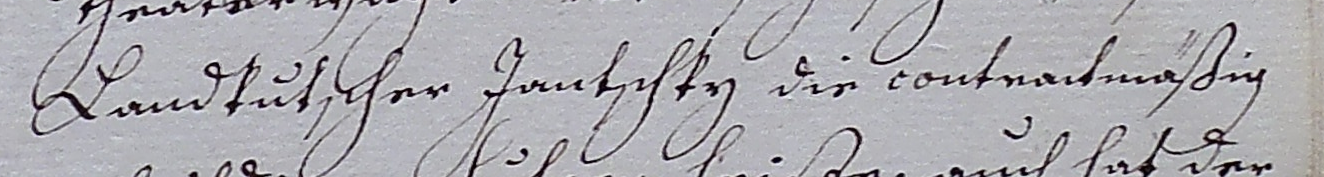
Landkutscher Jantschky die contractmäßig
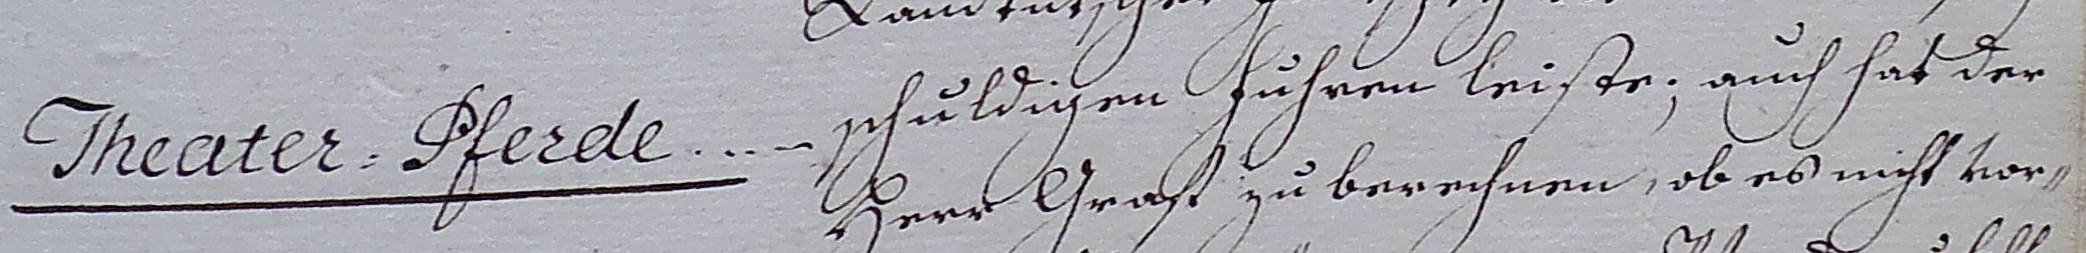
Theater=Pferde. . . . . schuldigen Fuhren leiste; auch hat der
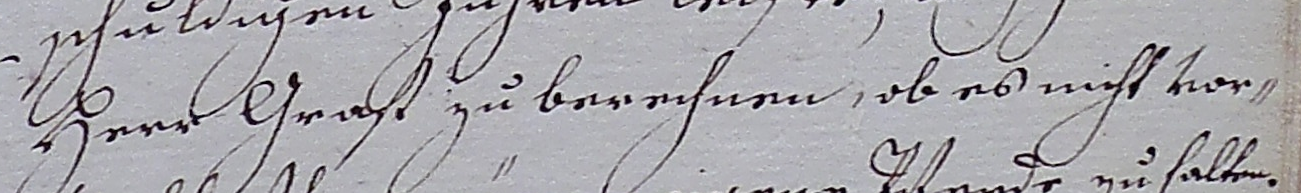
Herr Graf zu berechnen, ob es nicht vor¬
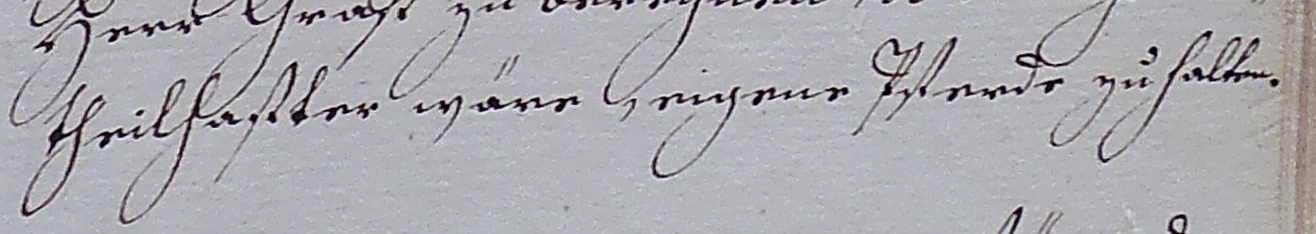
theilhafter wäre, eigene Pferde zu halten.
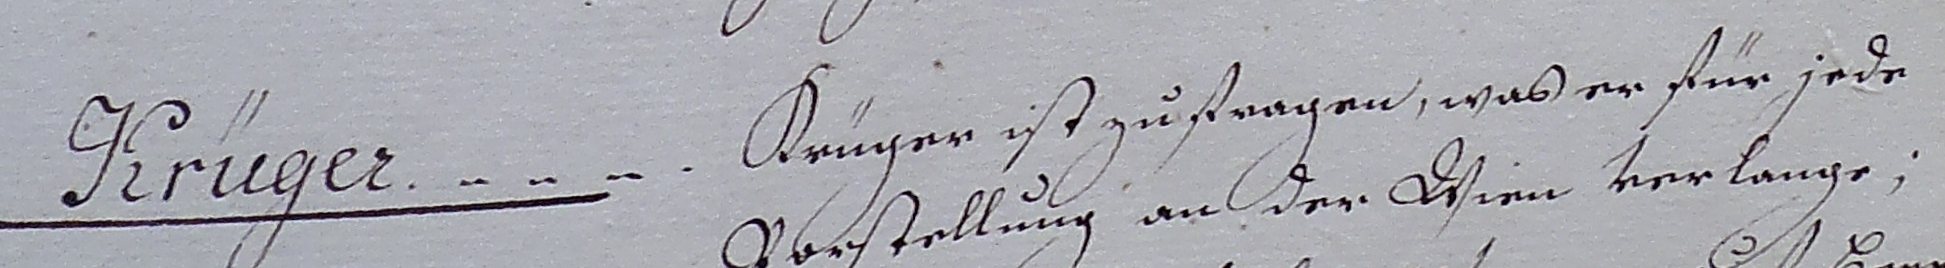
Krüger. .. .. .. . Krüger ist zu fragen, was er für jede
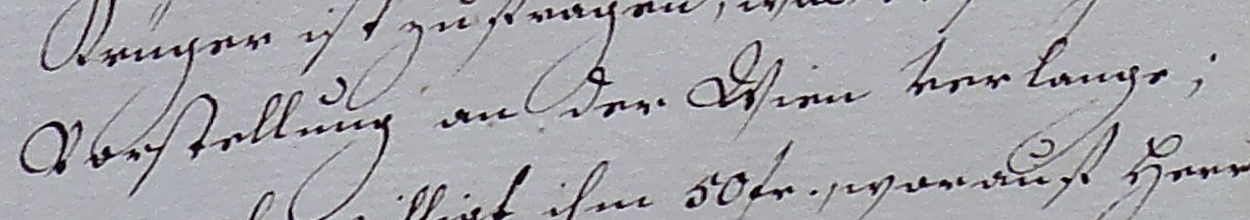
Vorstellung an der Wien verlange;
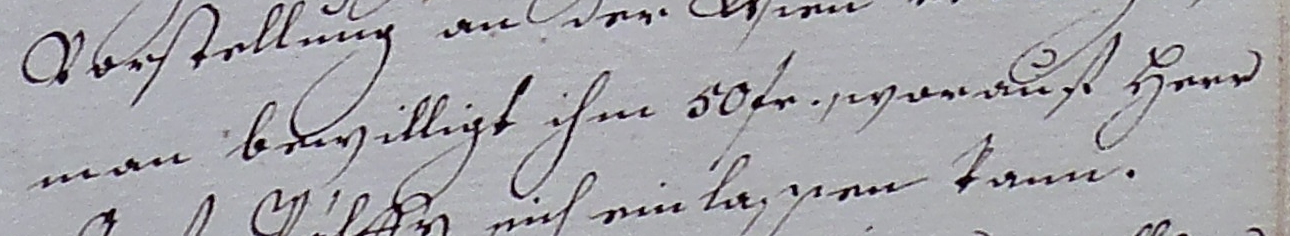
man bewilligt ihm 50fr., worauf Herr
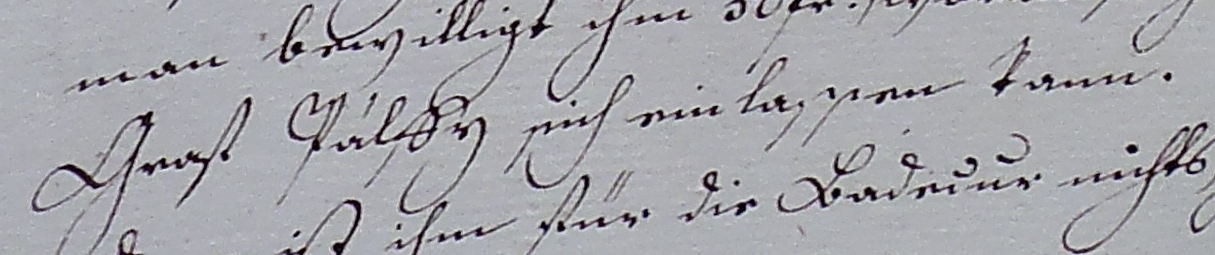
Graf Pálffy sich einlassen kann.
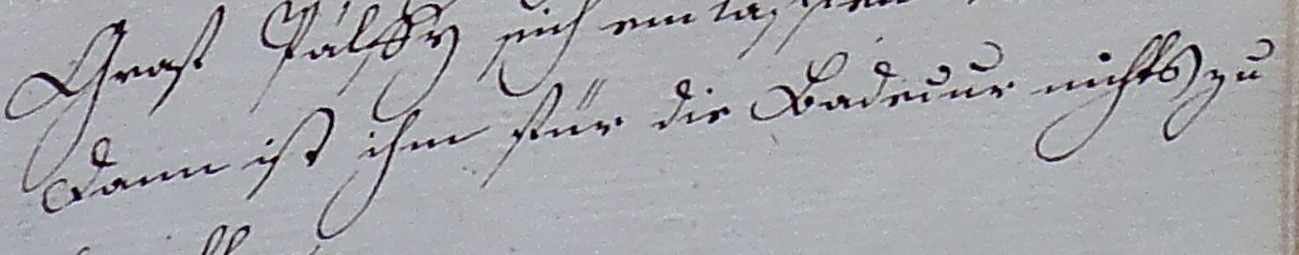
Dann ist ihm für die Badecur nichts zu
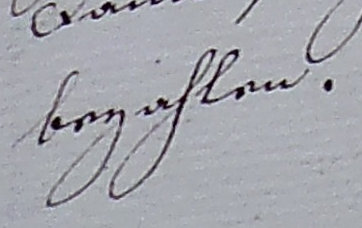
bezahlen.
